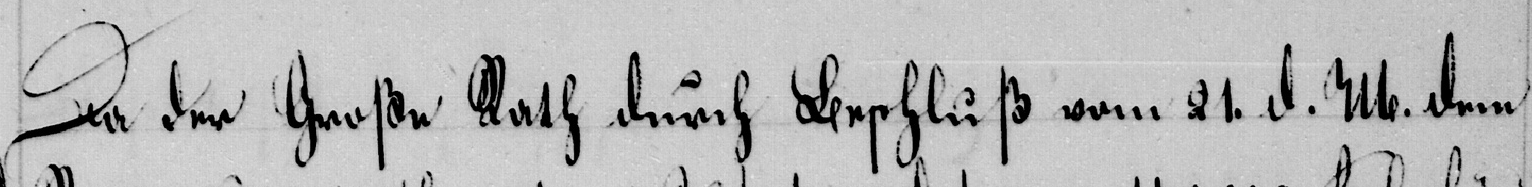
Da der Große Rath durch Beschluß vom 24. d. M. dem
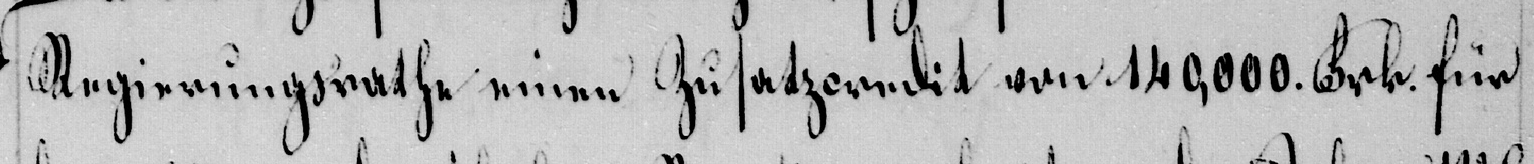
Regierungsrathe einen Zusatzcredit von 140,000. Frk. für
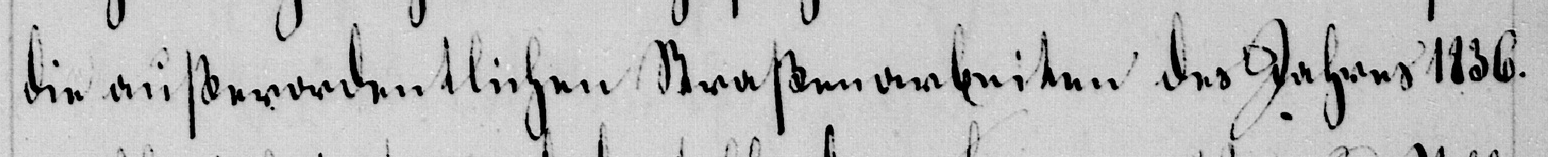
die außerordentlichen Straßenarbeiten des Jahres 1836.
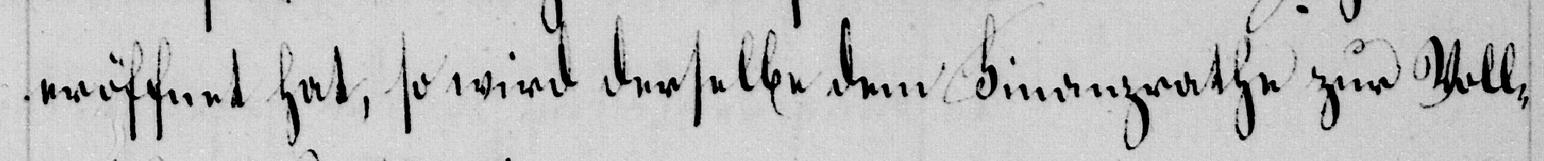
eröffnet hat, so wird derselbe dem Finanzrathe zur Voll¬
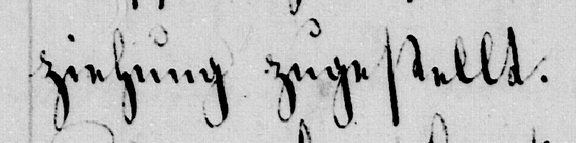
ziehung zugestellt.
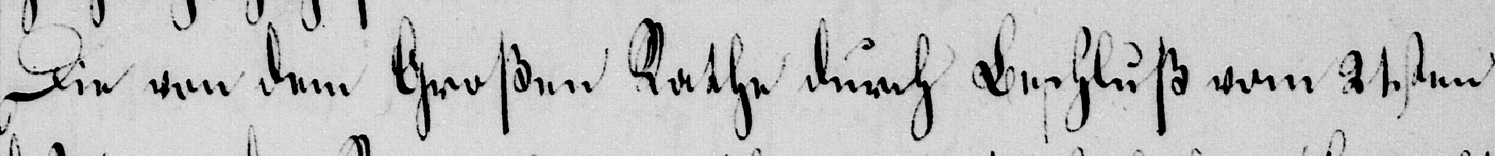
Die von dem Großen Rathe durch Beschluß vom 21.sten
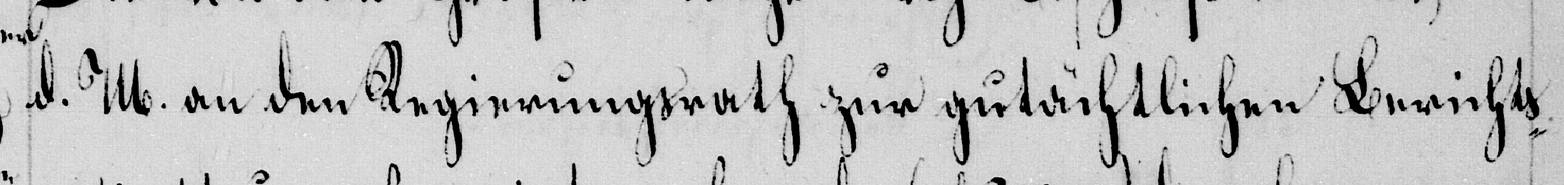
d. M. an den Regierungsrath zur gutächtlichen Berichts¬
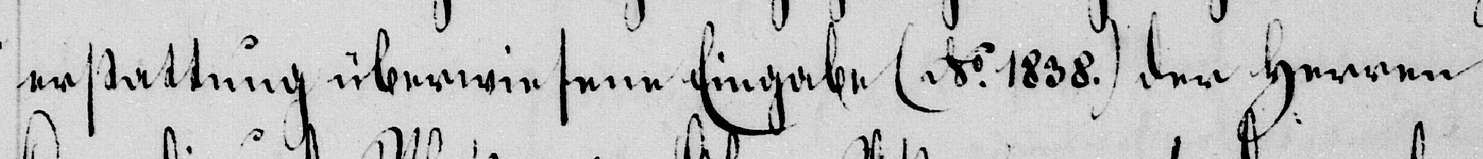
erstattung überwiesene Eingabe (No. 1838.) der Herren
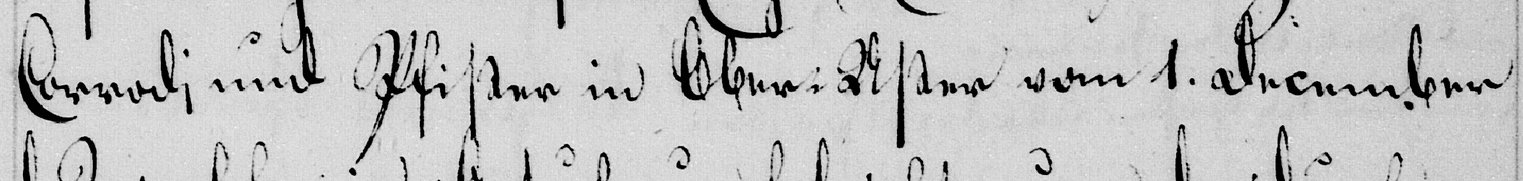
Corrodi und Pfister in Ober-Uster vom 1. December
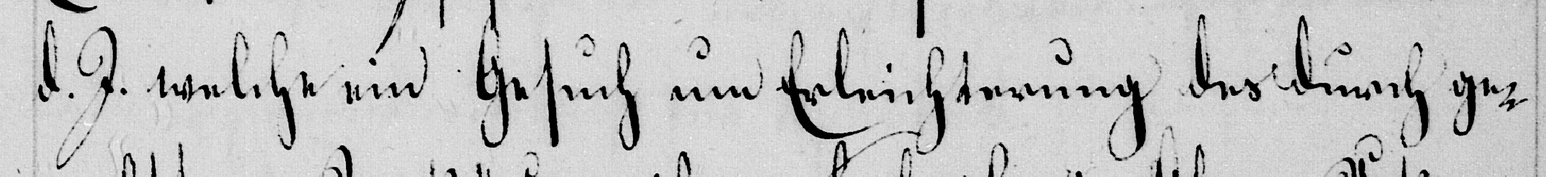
d. J. welche ein Gesuch um Erleichterung des durch ge¬
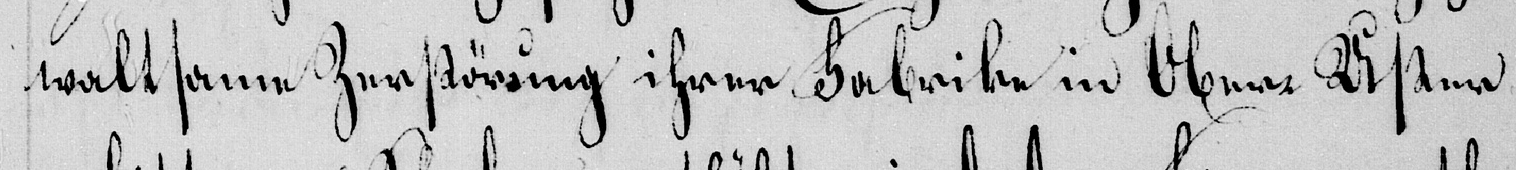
waltsame Zerstörung ihrer Fabrike in Ober-Uster
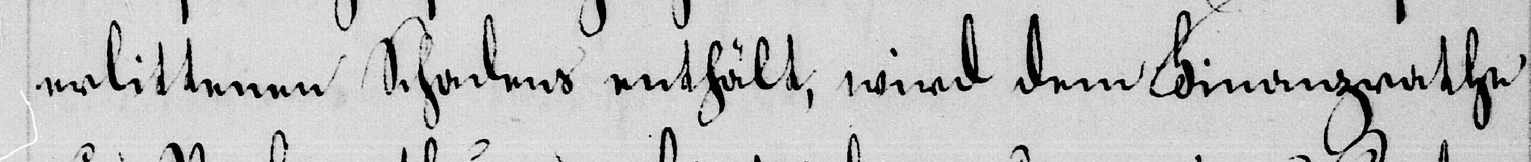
erlittenen Schadens enthält, wird dem Finanzrathe
